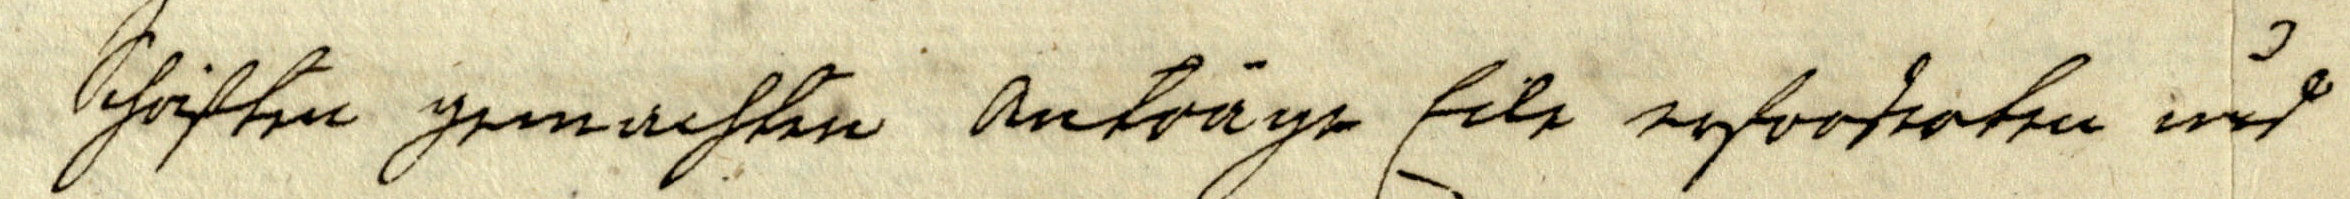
Schriften gemachten Anträge Eile erforderten und
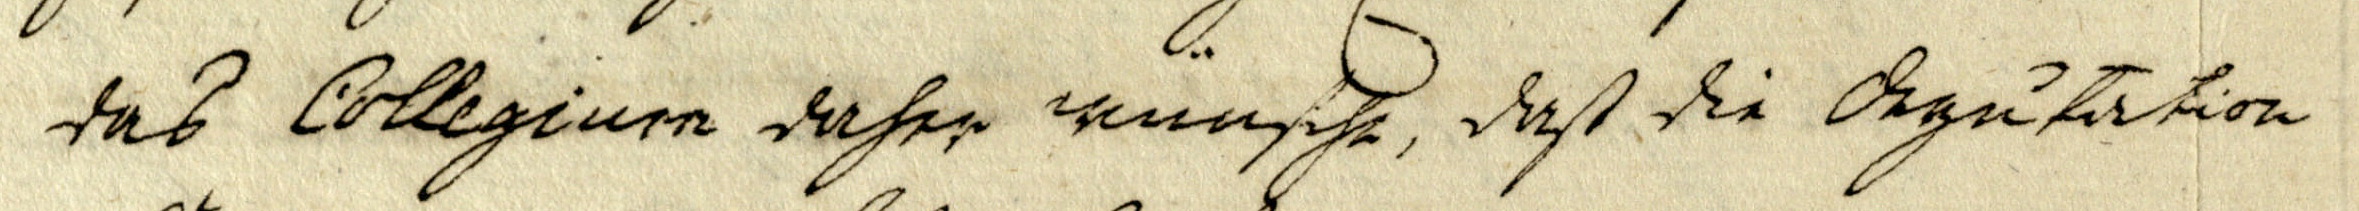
das Collegium daher wünsche, daß die Deputation
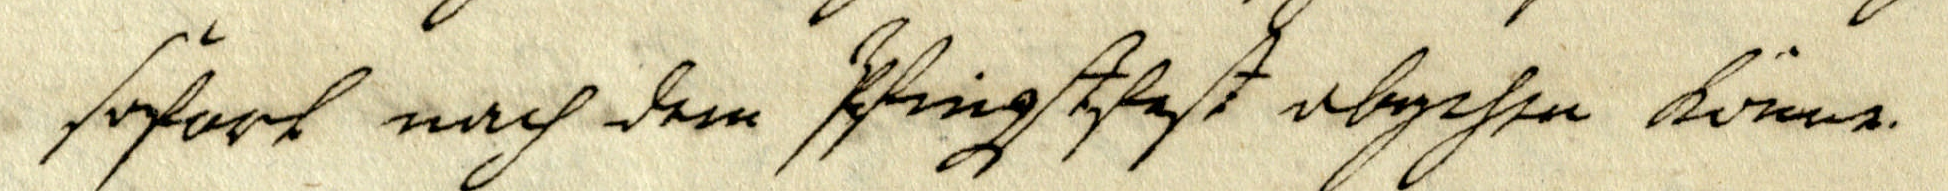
sofort nach dem Pfingstfest abgehen könne.
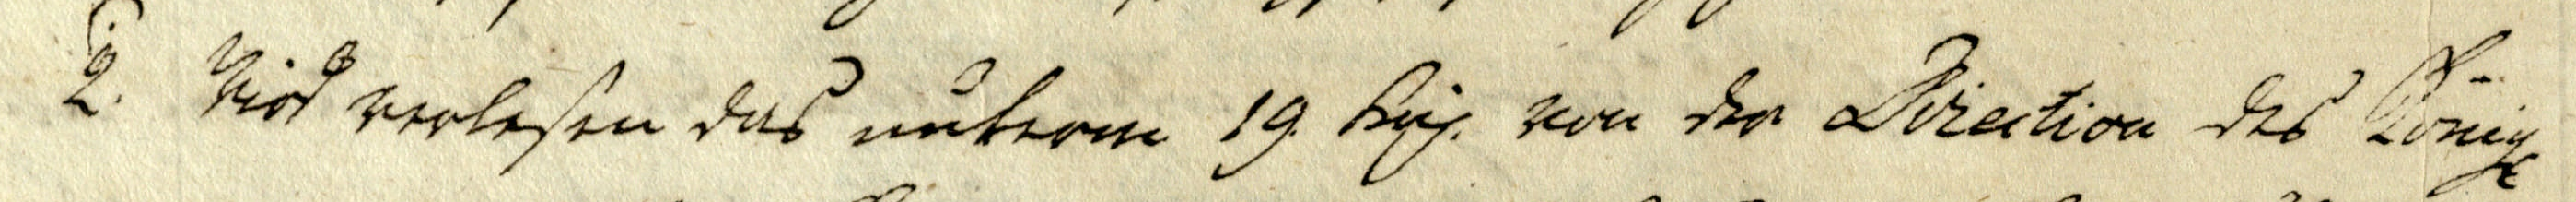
2. Wird verlesen das unterm 19. huj. von der Direction des König.
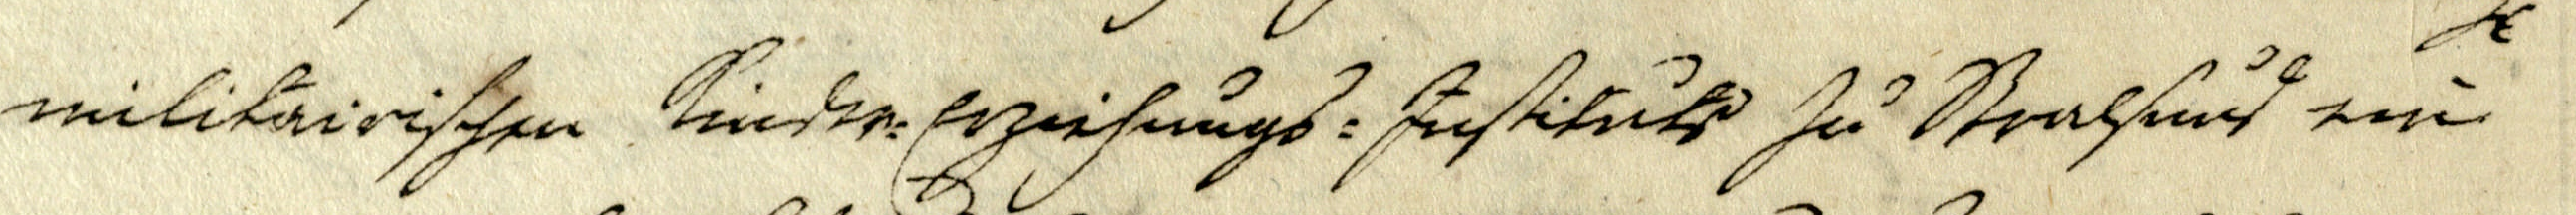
militairischen Kinder-Erziehungs-Instituts zu Stralsund ein¬
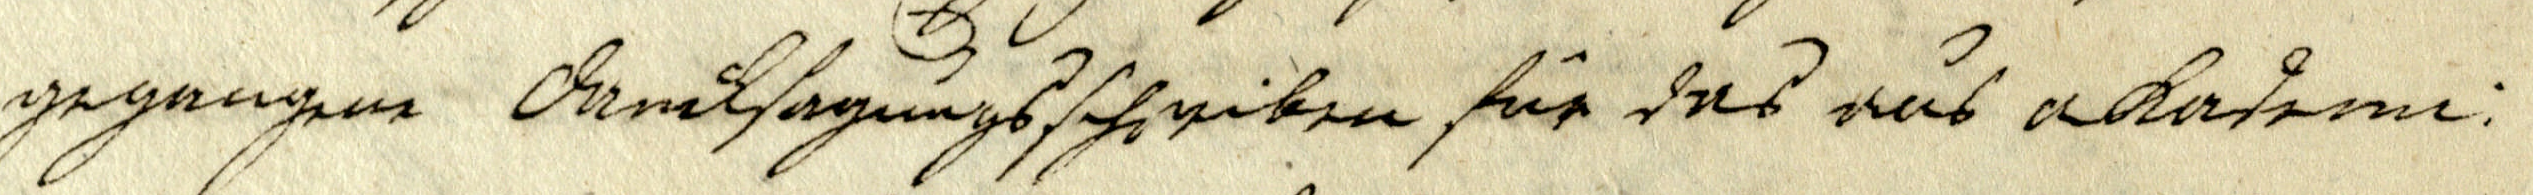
gegangene Dancksagungsschreiben für das aus akademi¬
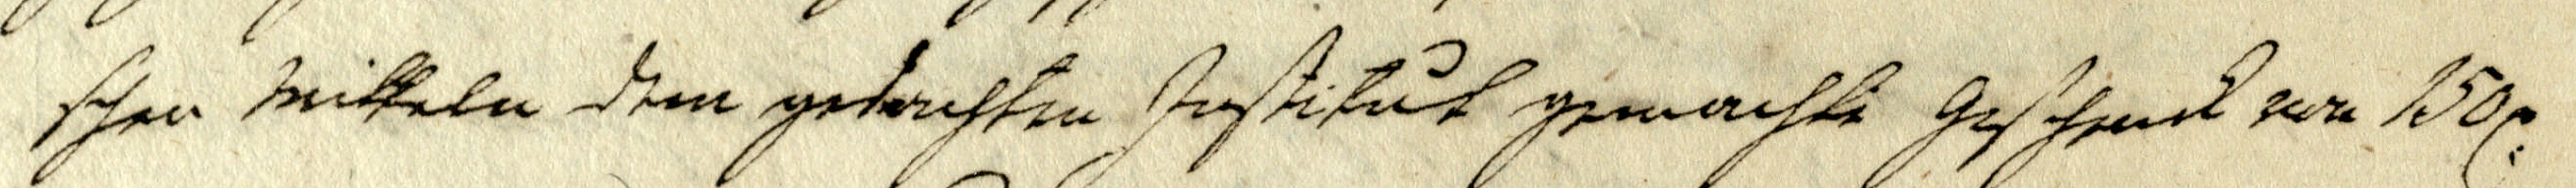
schen Mitteln dem gedachten Institut gemachte Geschenck von 150 l.
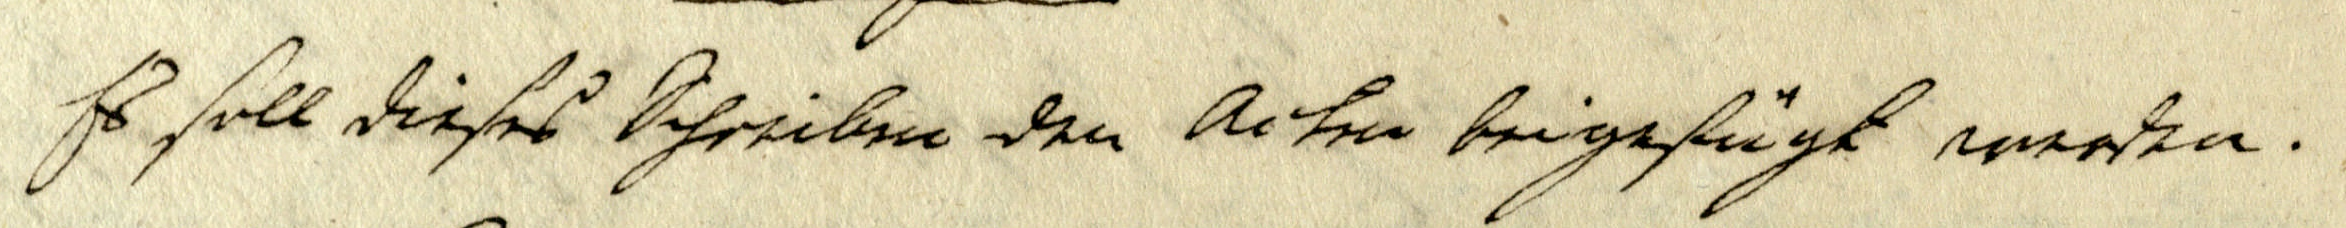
Es soll dieses Schreiben den Acten beigefügt werden.
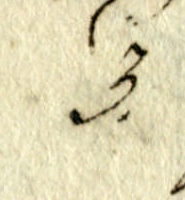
3.
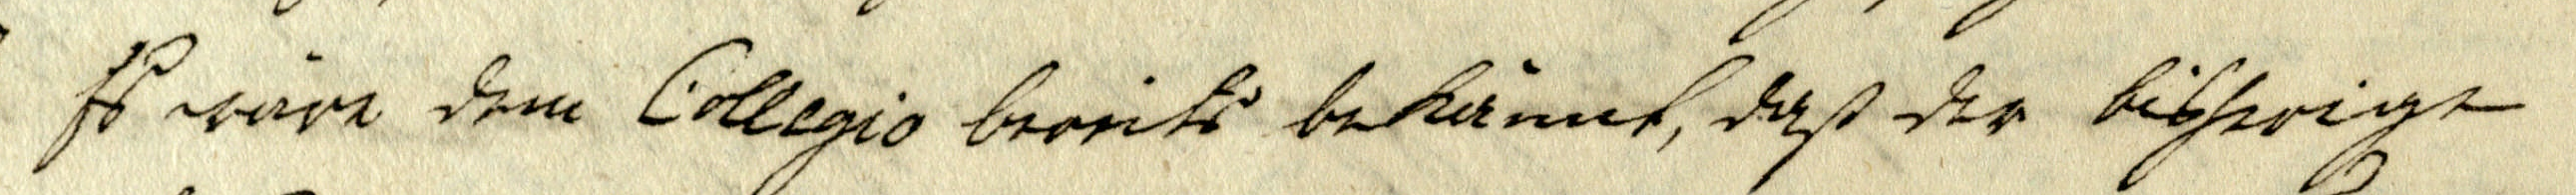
Es wäre dem Collegio bereits bekannt, daß der bisherige
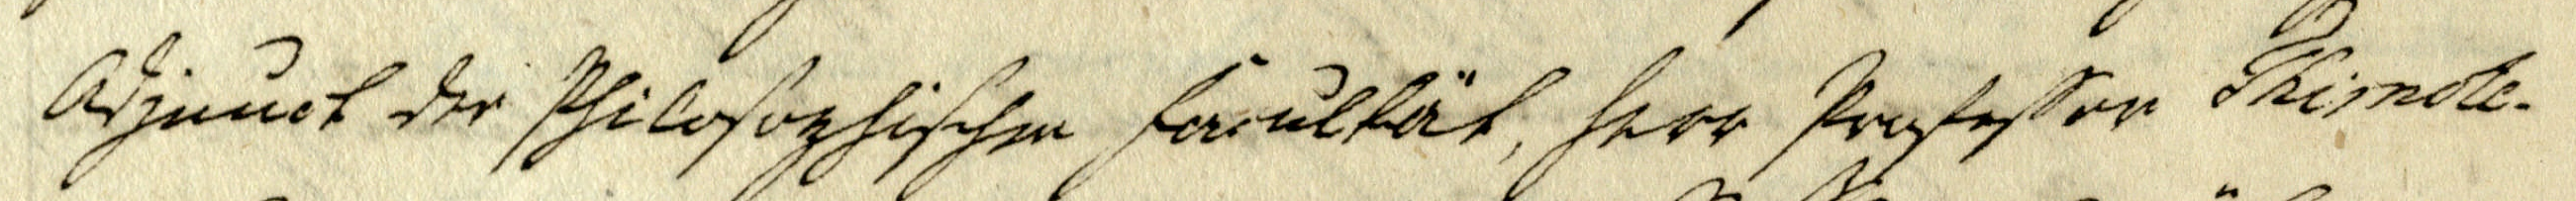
Adjunct der Philosophischen Facultät, herr Professor Thimote¬
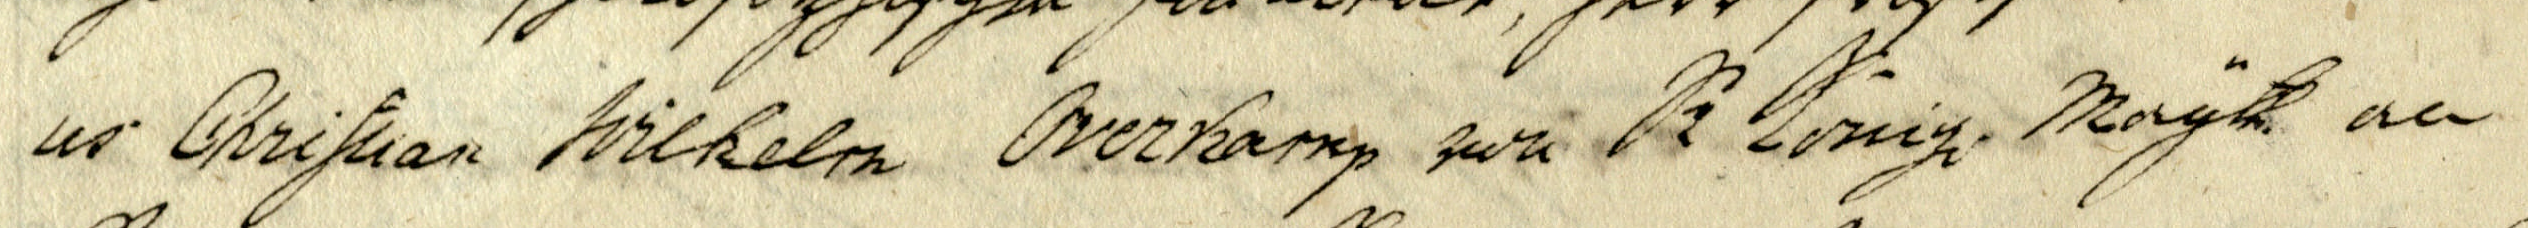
us Christian Wilhelm Overkamp von Sr. König. Maÿtt. an
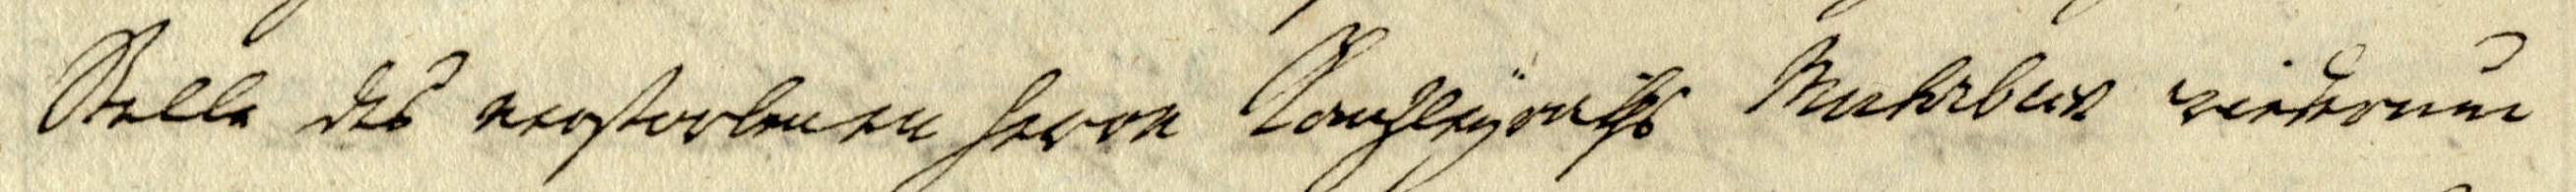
Stelle des verstorbenen herrn Kanzleÿraths Muhrbeck wiederum
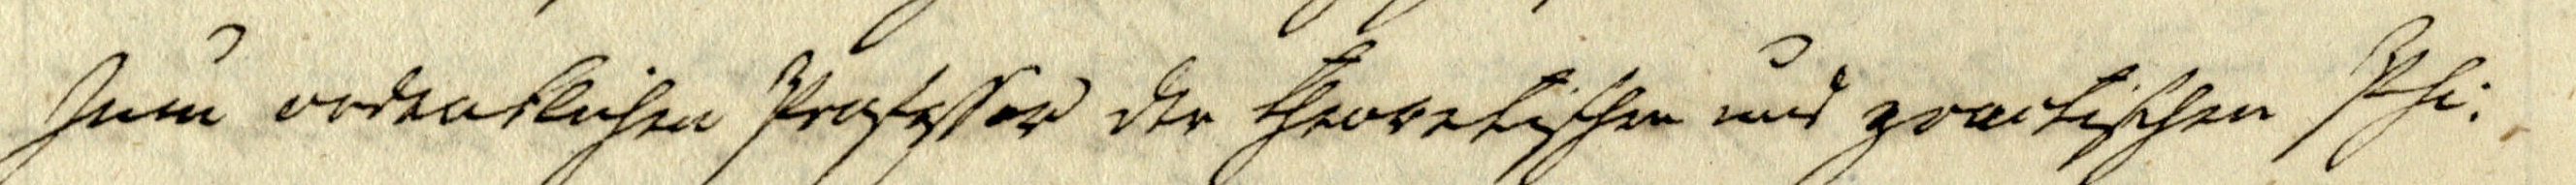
zum ordentlichen Professor der theoretischen und practischen Phi¬
